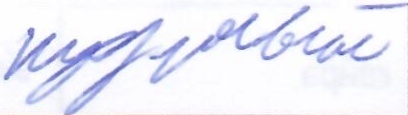кудрявий
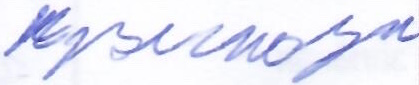краснозх
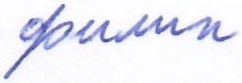филин
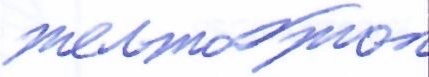желтобрюх
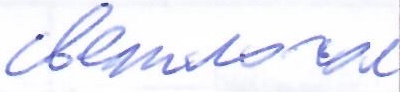светлогол
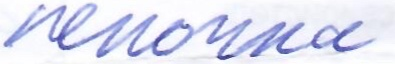пеночка
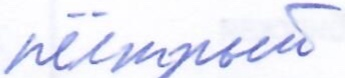пёстрый
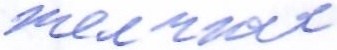желчняя
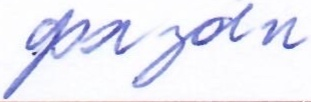фазан
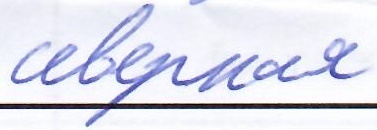северная
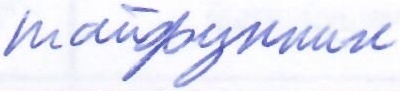тайфунник
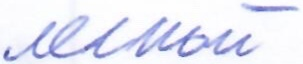лесной
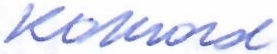конюга
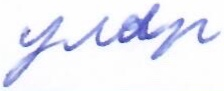улар
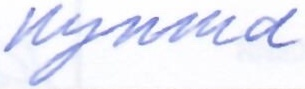кукша
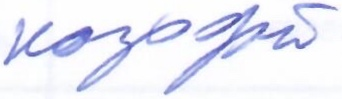козофй
